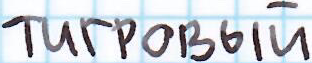тигровый
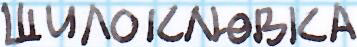шилоклювка
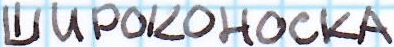широконоска
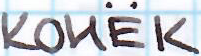конёк
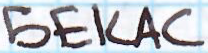бекас
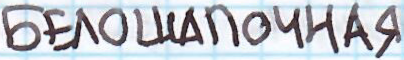белошапочная
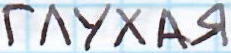глухая
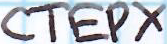стерх
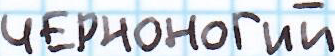черноногий
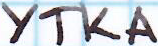утка
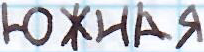южная
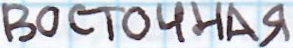восточная
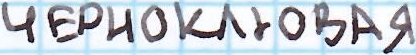черноклювая
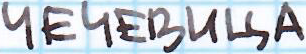чечевица
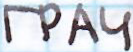грач
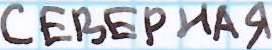северная
